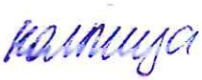колпица
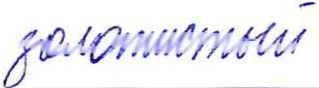золотистый
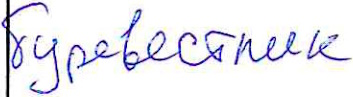буревестник
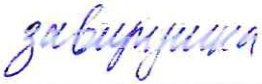завирушка
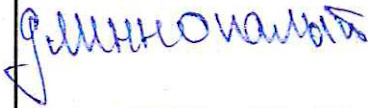длиннопалый
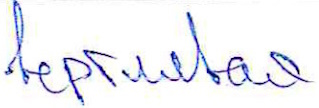вертлявая
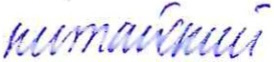китайский
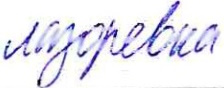лазоревка
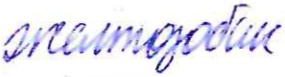желтозобик
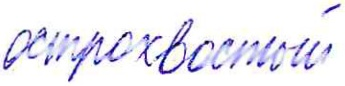острохвостый
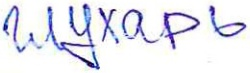глухарь
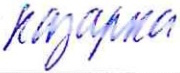казарка
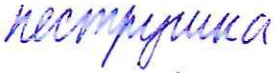пеструшка
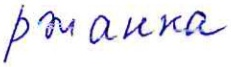ржанка
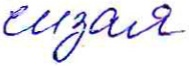сизая
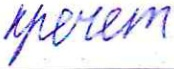кречет
